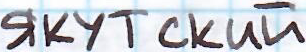якутский
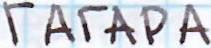гагара
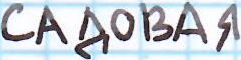садовая
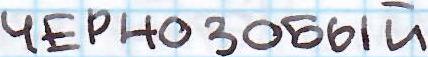чернозобый
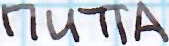питта
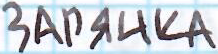зарянка
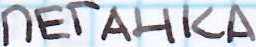пеганка
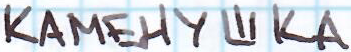каменушка
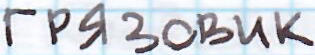грязовик
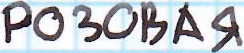розовая
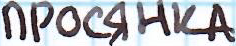просянка
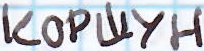коршун
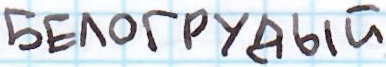белогрудый
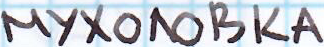мухоловка
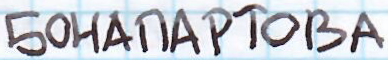бонапартова
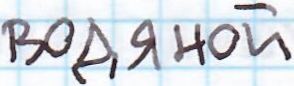водяной
